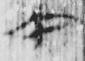午
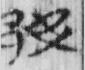○（鄢）
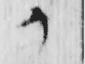人
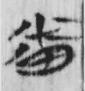番
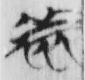羕
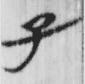子
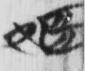姬
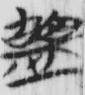○（盬）
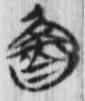魯
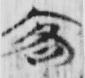客
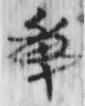尃
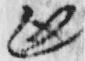臣
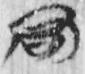君
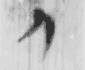人
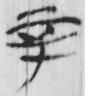辛
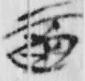酉
